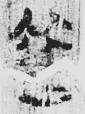昔
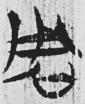周
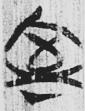室
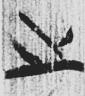之
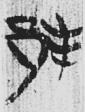邦
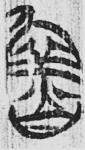魯
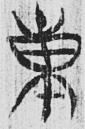東
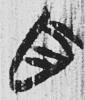西
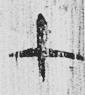七
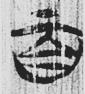百
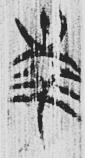南
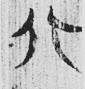北
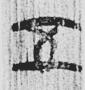五
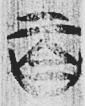百
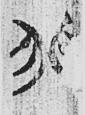非
